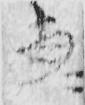十月
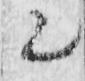乙
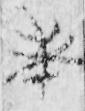未
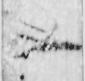之
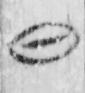日
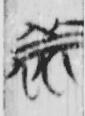羕
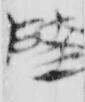陵
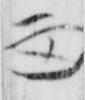正
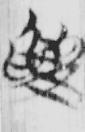婁
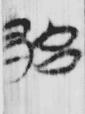郘
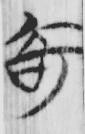奇
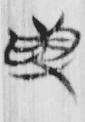受
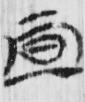○（期）
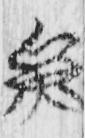○（爨）
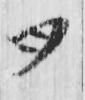月
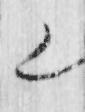乙
